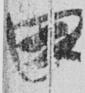母
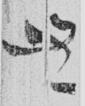又（有）
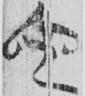它
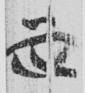正
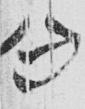公
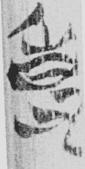事
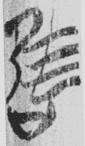唯（雖）
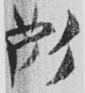死
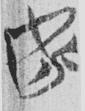𡚦（焉）
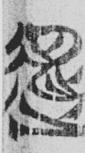逃
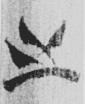之
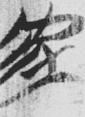○（吾）
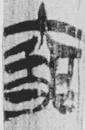○（聞）
